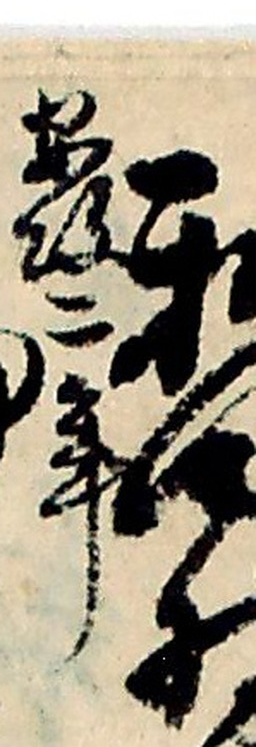安政二年
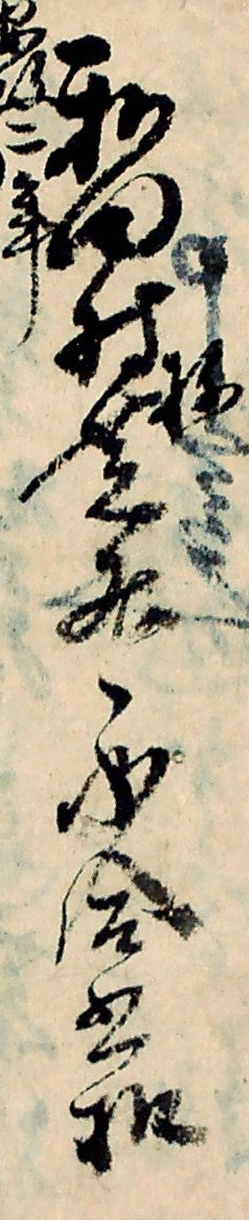和田村操芝居承合書控
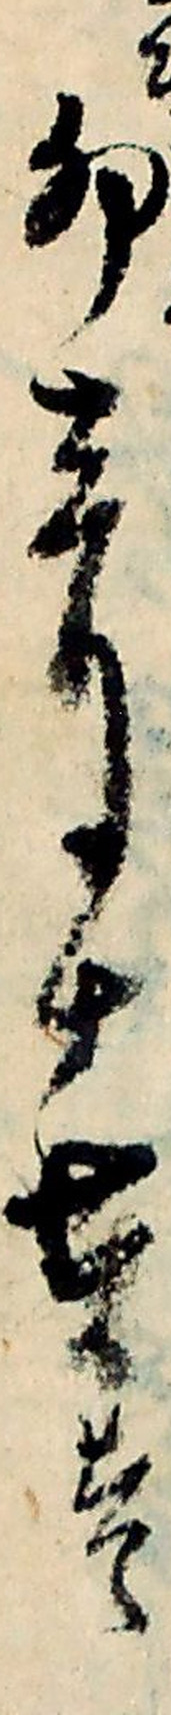卯十二月十七日著

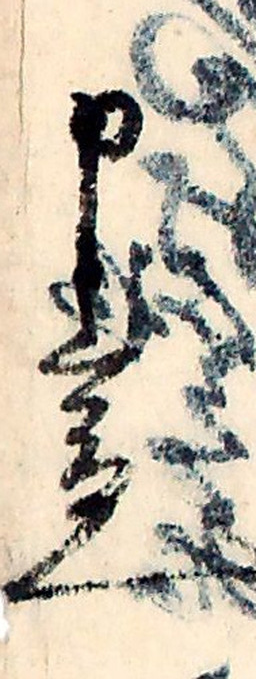申上覚
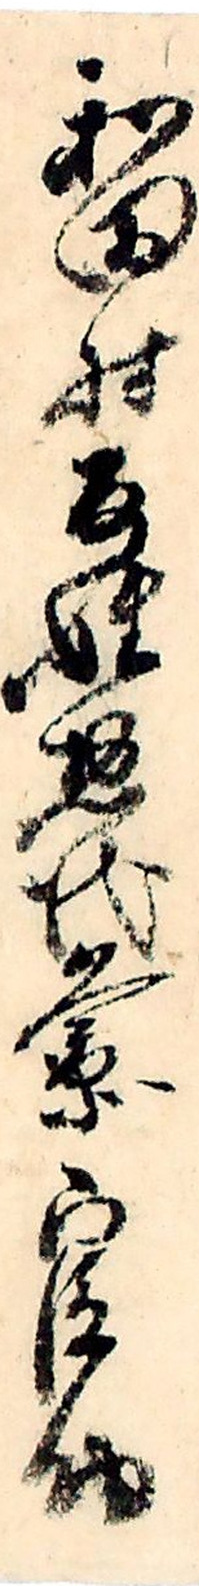和田村百姓惣代久兵衛官助
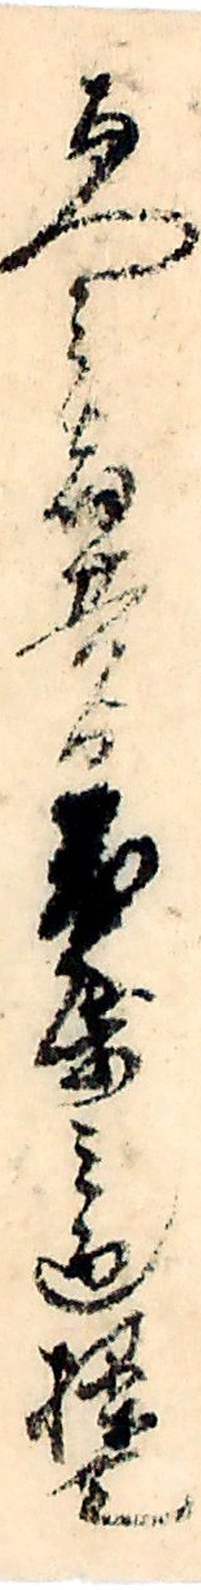両人之者共ゟ別紙之通操芝
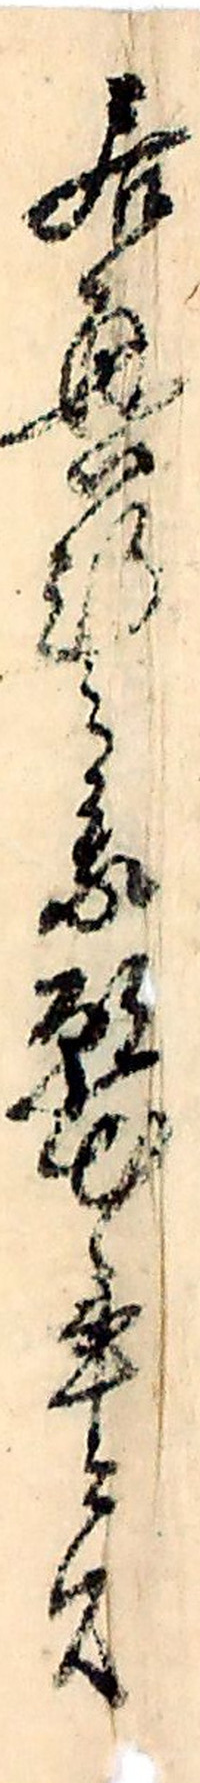居興行之義願出候事に候
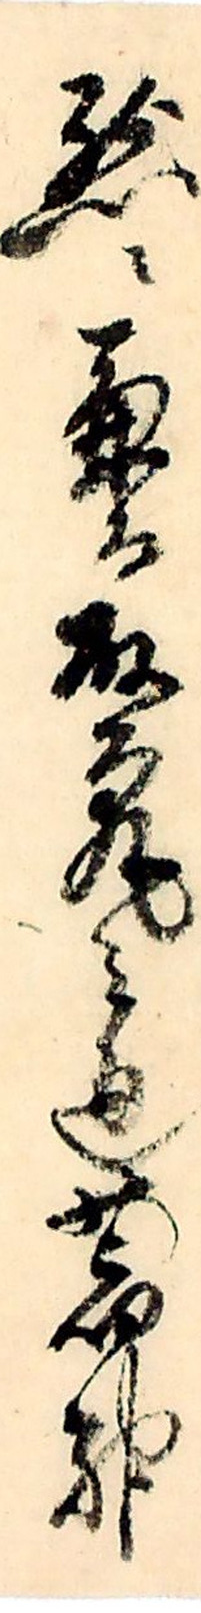然に兼て取究之通著神
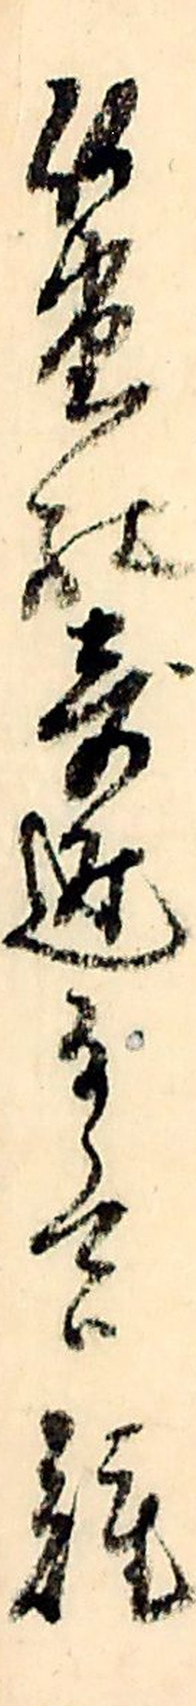仏堂社奇進ならては難
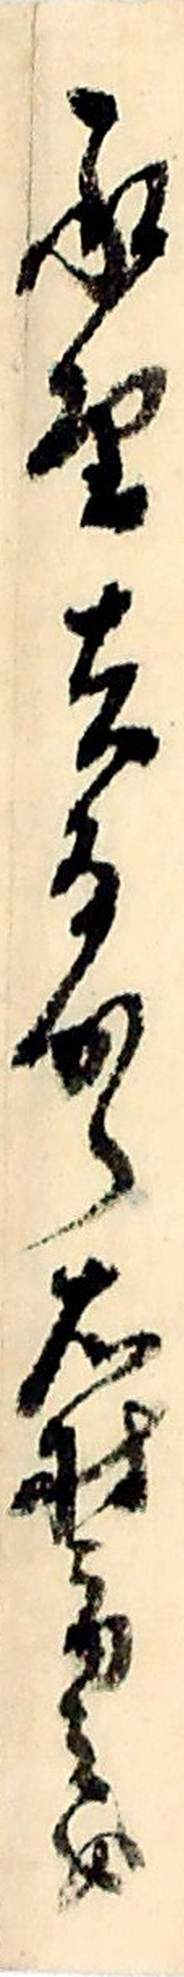承届去なから右村方之義
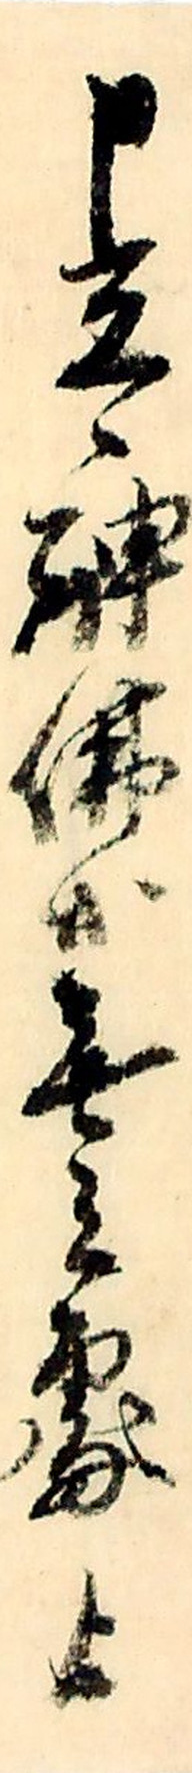申立候神仏等無之処ゟ
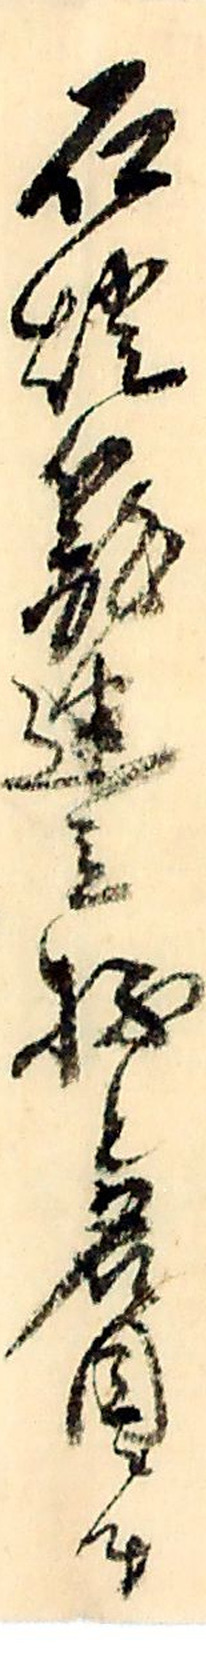石灯籠建立抔と名目を付
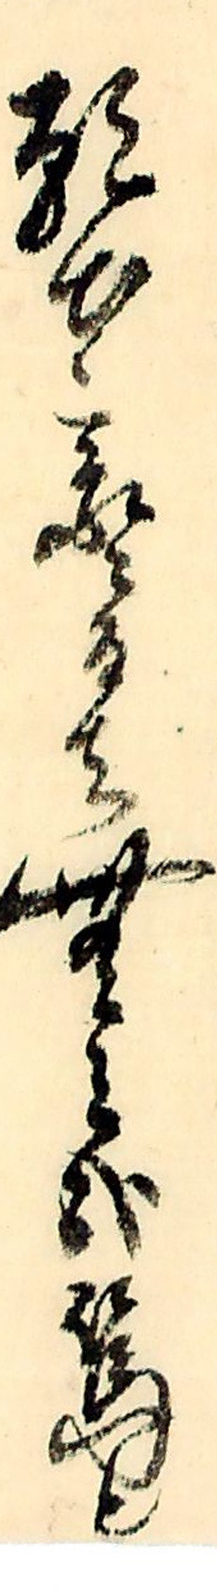願出候義にては無之哉篤と
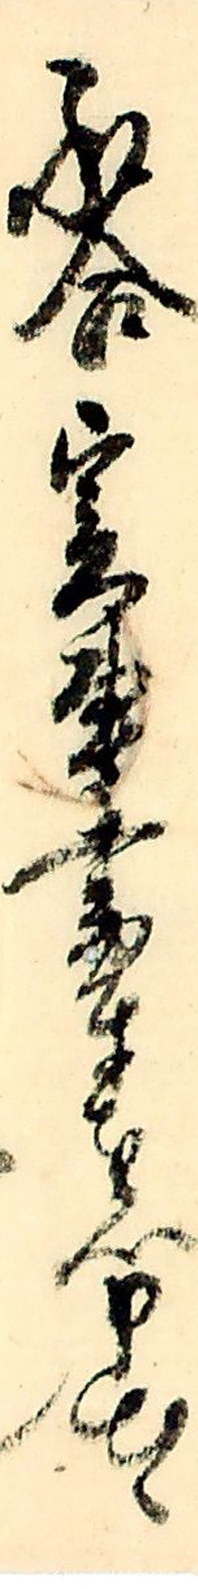承合実事書付を以申出候
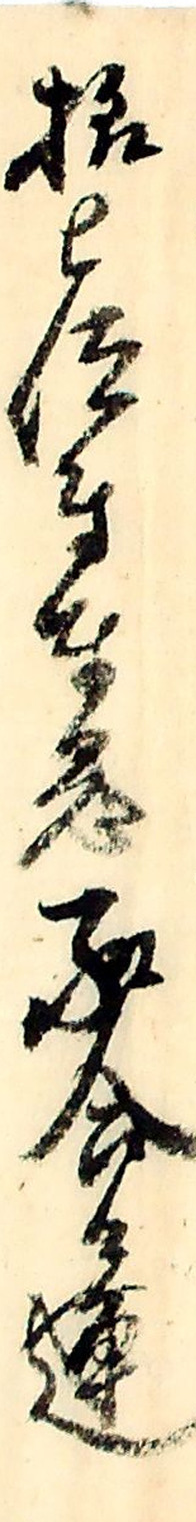様被仰付奉畏承合候運
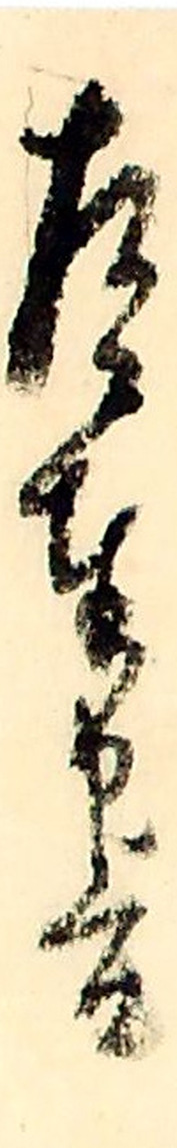左に奉申上候
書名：和田村操芝居不合書控
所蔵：鳴門教育大学 Naruto University of Education
